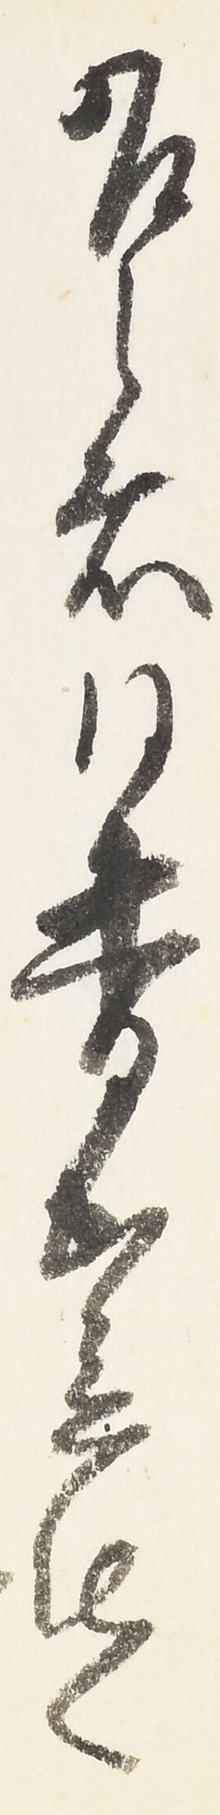右之者同六日出立仕候
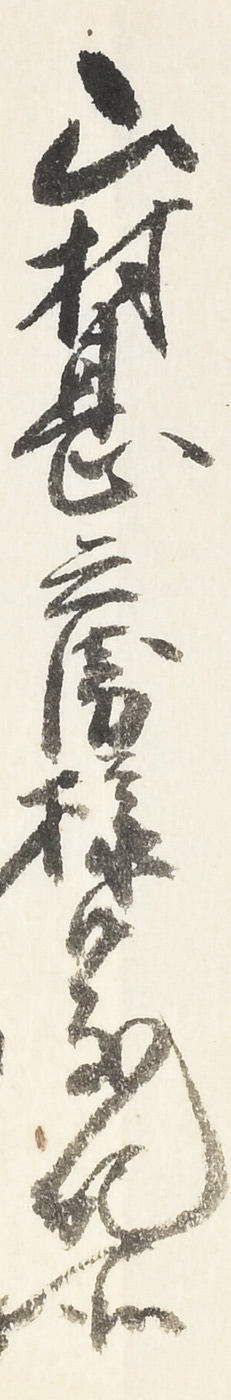山村甚兵衛様御支配所
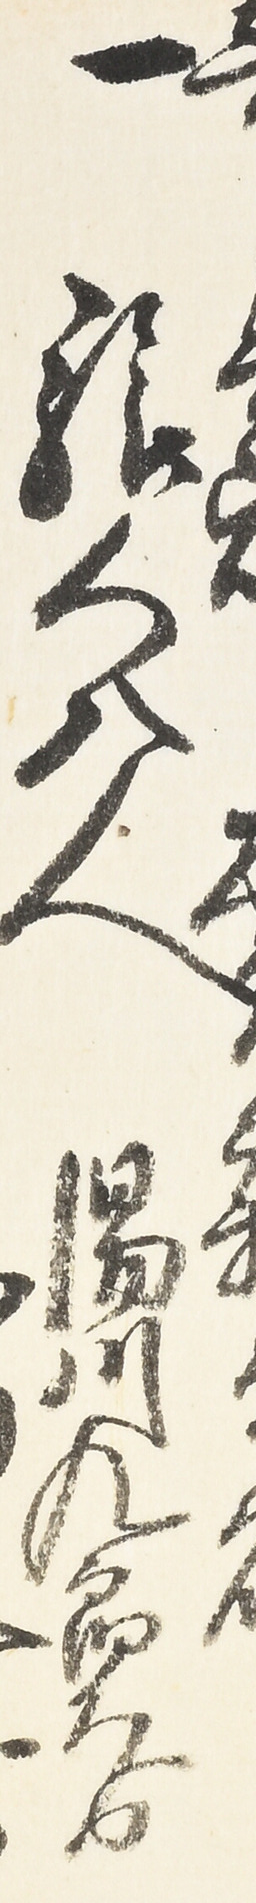一旅人八人湯川九郎右衛門
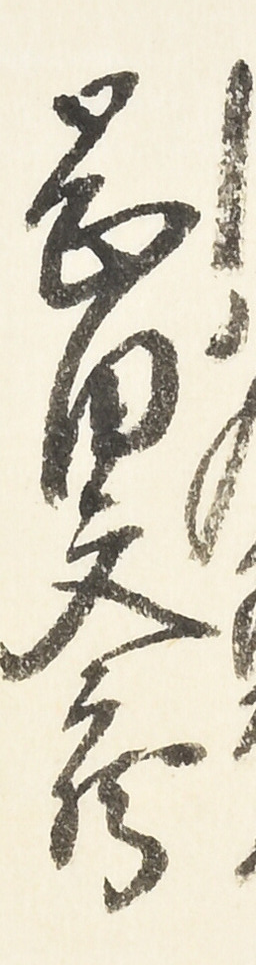岡田文蔵
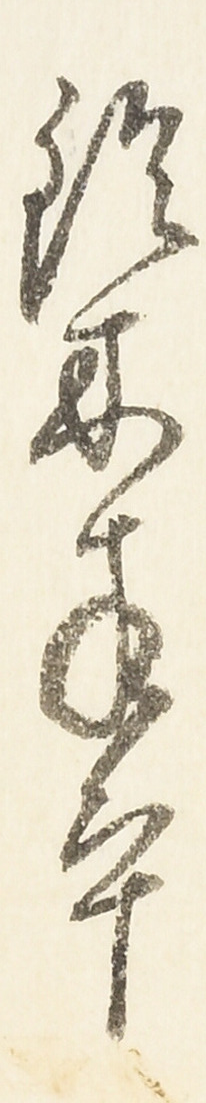鈴木半平
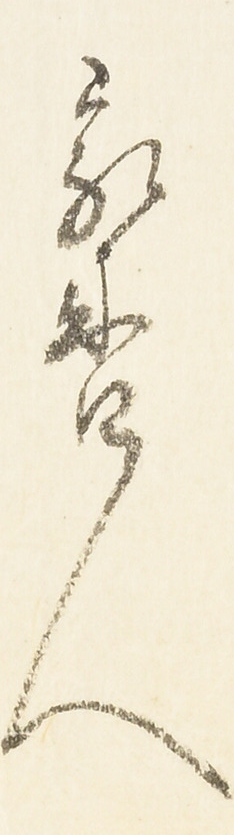家来四人
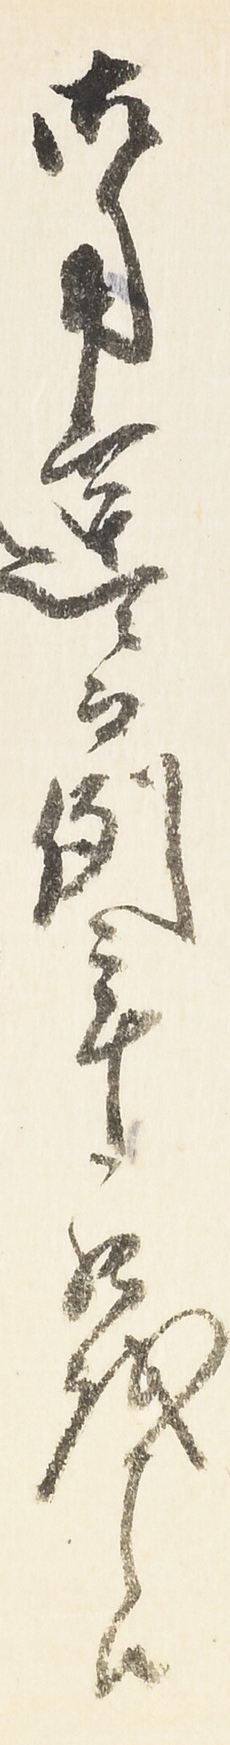御用達ニ而例年罷越申候
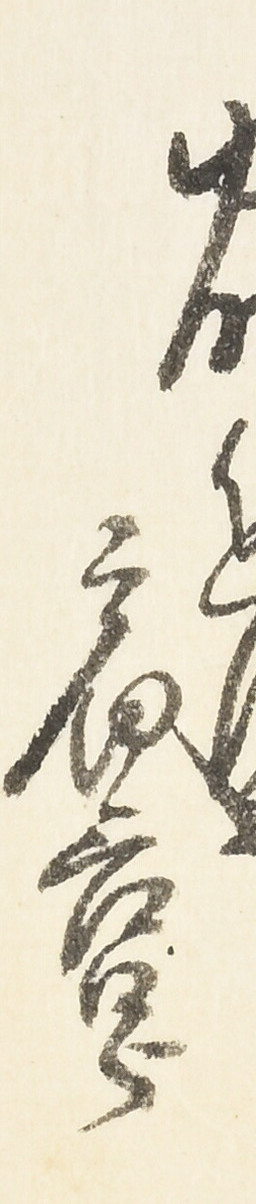宿善四郎
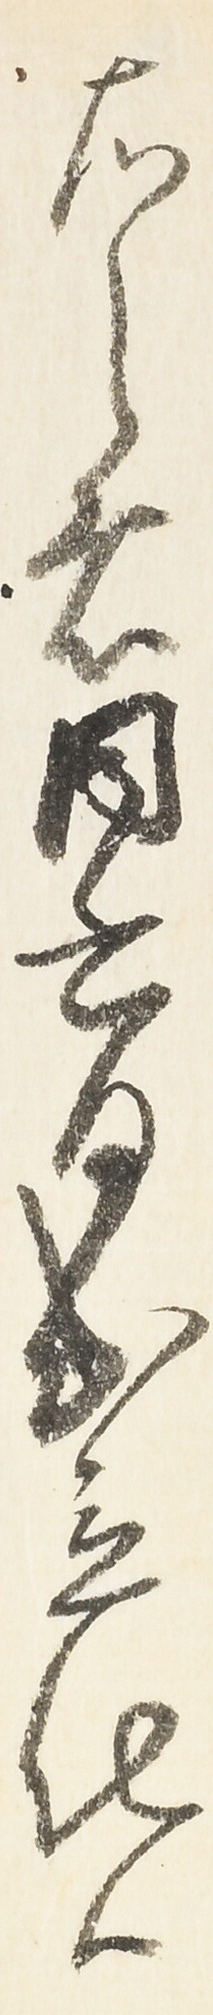右之者同六日出立仕候
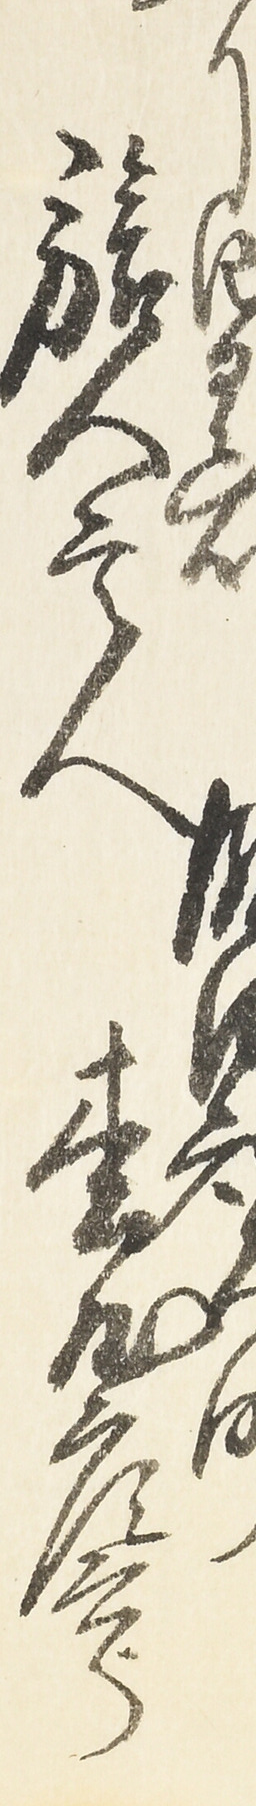一旅人壱人松屋彦太郎
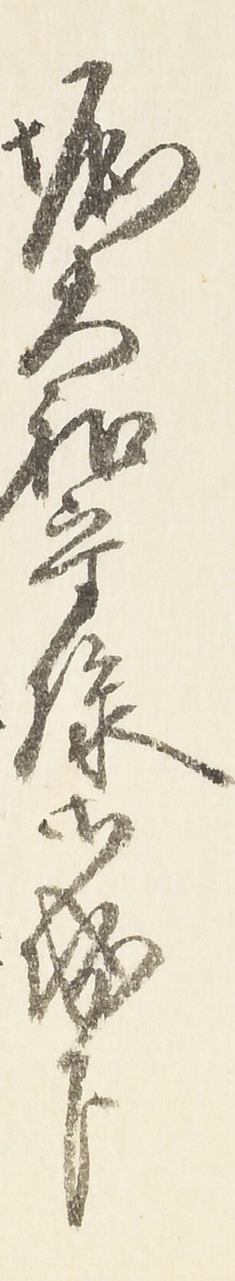堀大和守様御城下
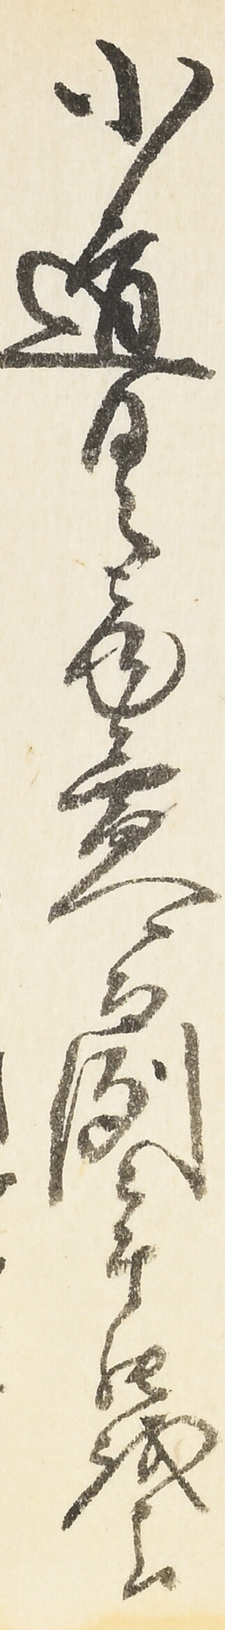小道具商売ニ而例年罷越申候
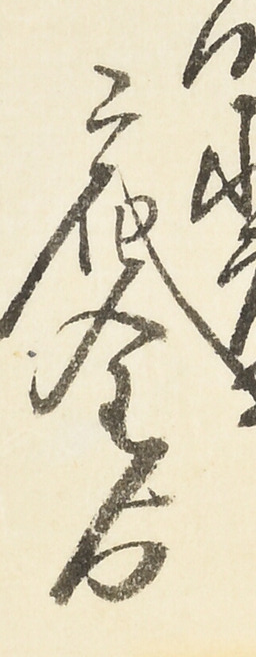原兵右衛門
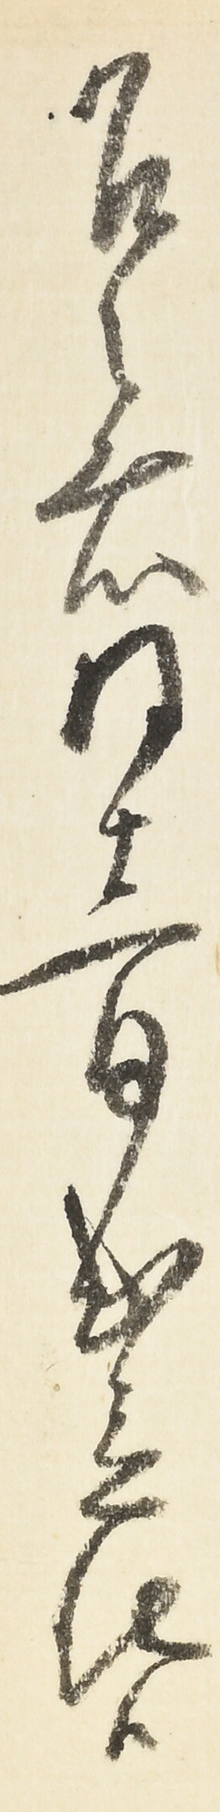右之者同十二日出立仕候
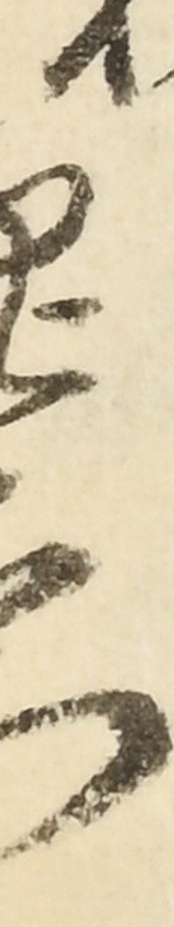原兵右衛門

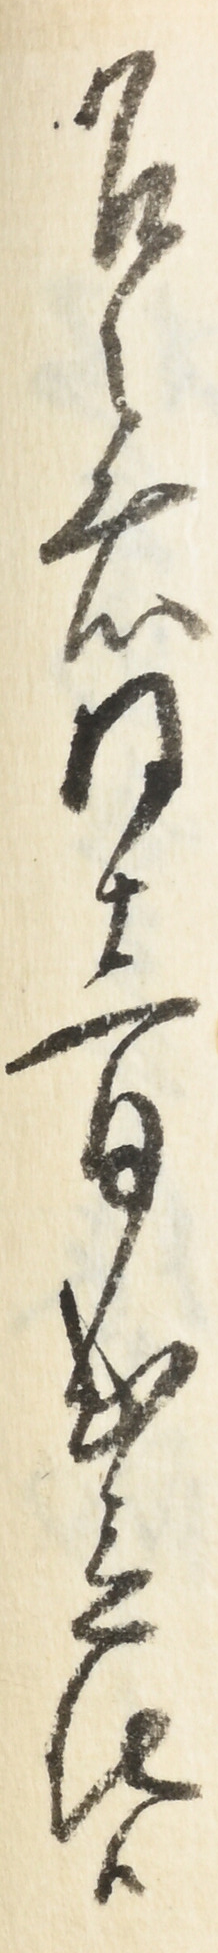右之者十二月七日出立仕候
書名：町中旅人泊控帳
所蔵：伊那市立高遠町図書館・合同会社AMANE
